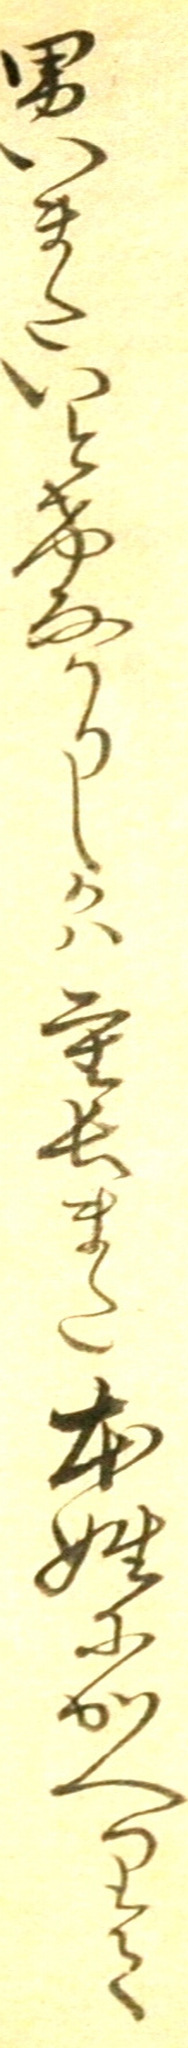男いまたいとけなかりしかは重長また本姓にかへりて
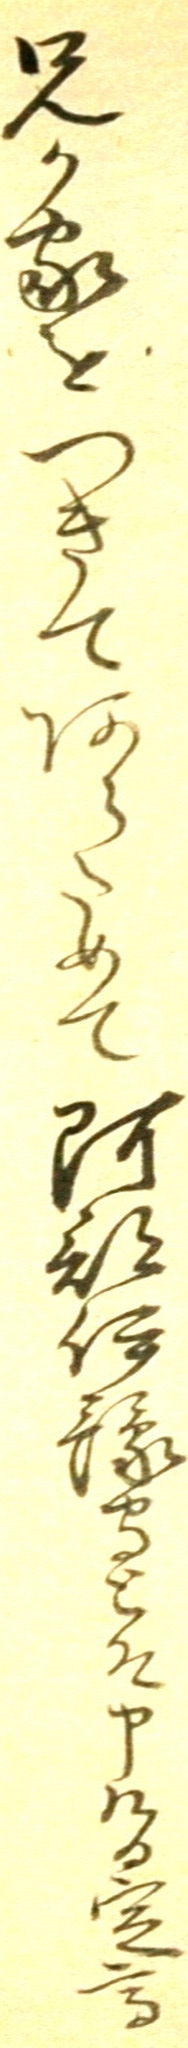兄か家をつきてあらためて阿部伊予守とそ申ける定高
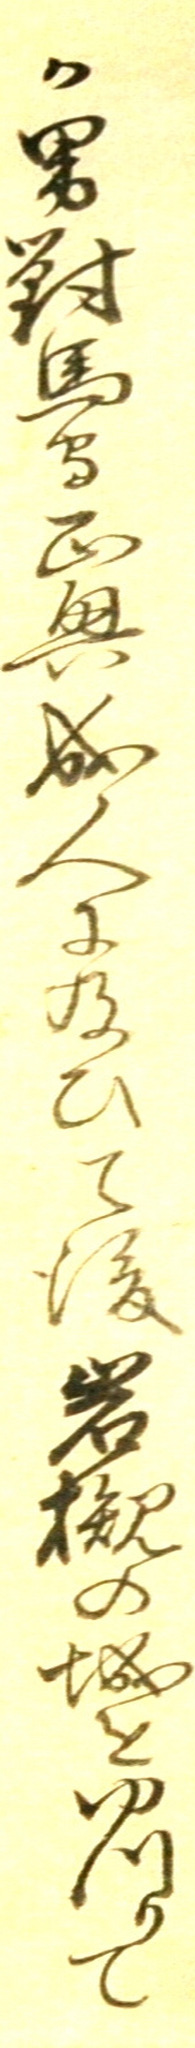か男対馬守正興成人に及ひて後岩槻の城をゆつりて

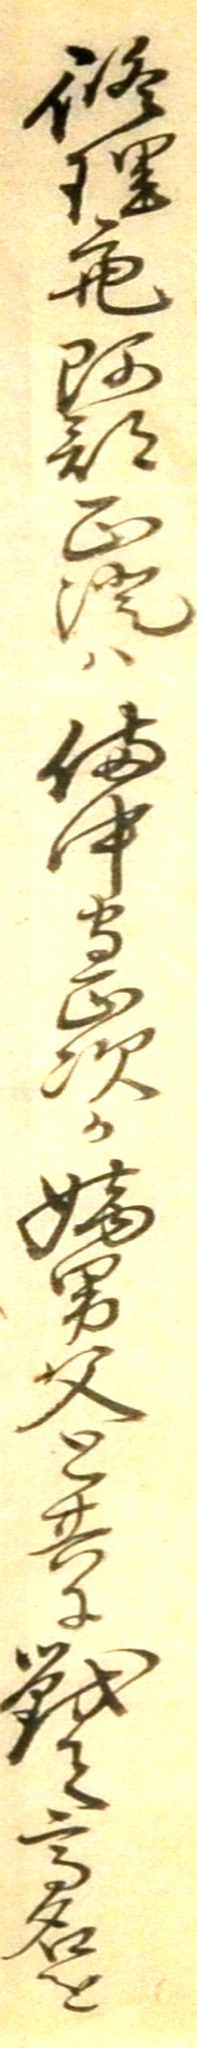修理亮阿部正澄は備中守正次か嫡男父と共に戦て高名を
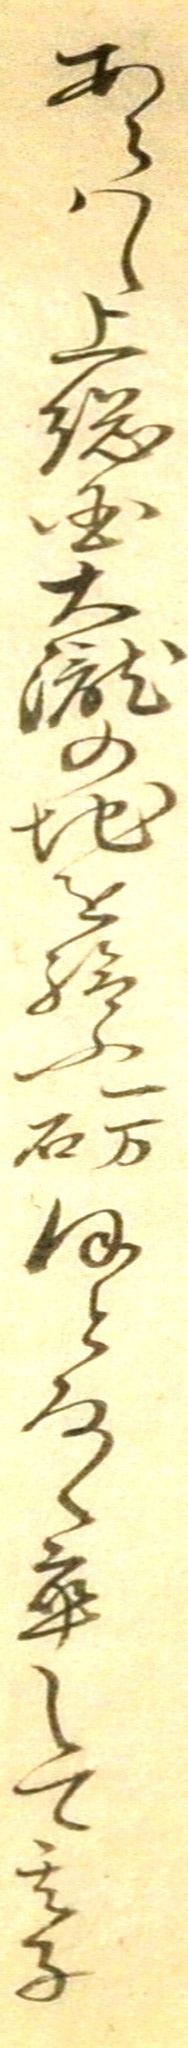あらはし上総国大滝の地を給ふ一万石ほとなく卒して其子
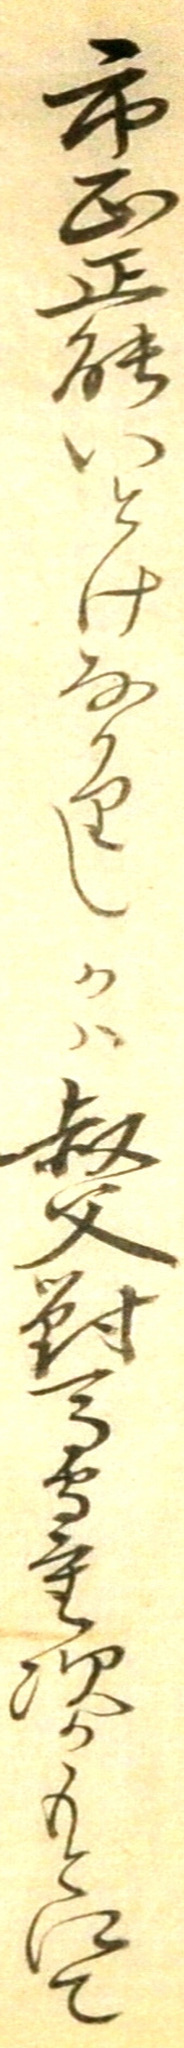市正正能いとけなかりしかは叔父対馬守重次かもとにて
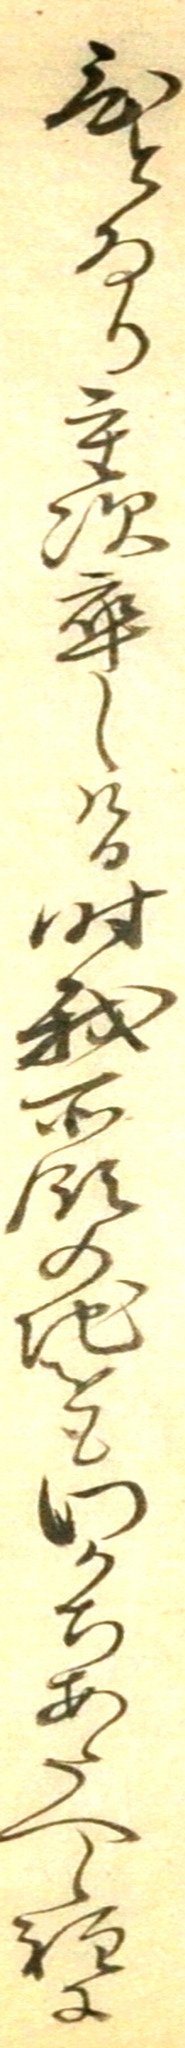ひとなり重次卒しける時我所領の地をもわかちあたへし程に
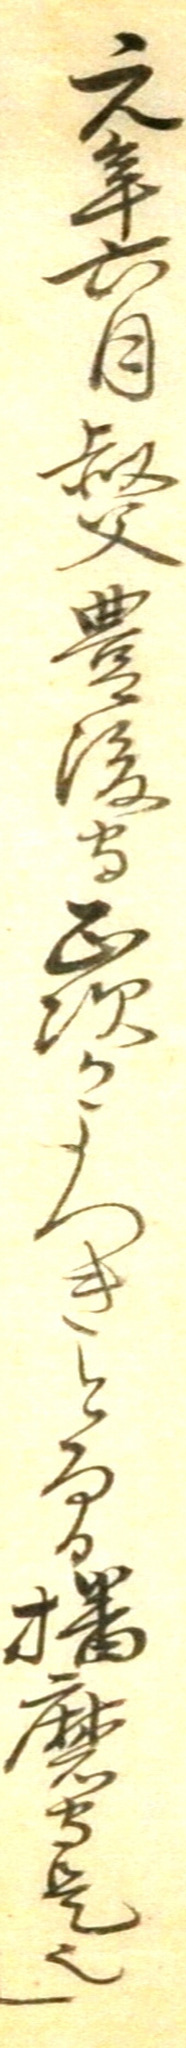元年六月叔父豊後守正次かよつきとなる播磨守是也」
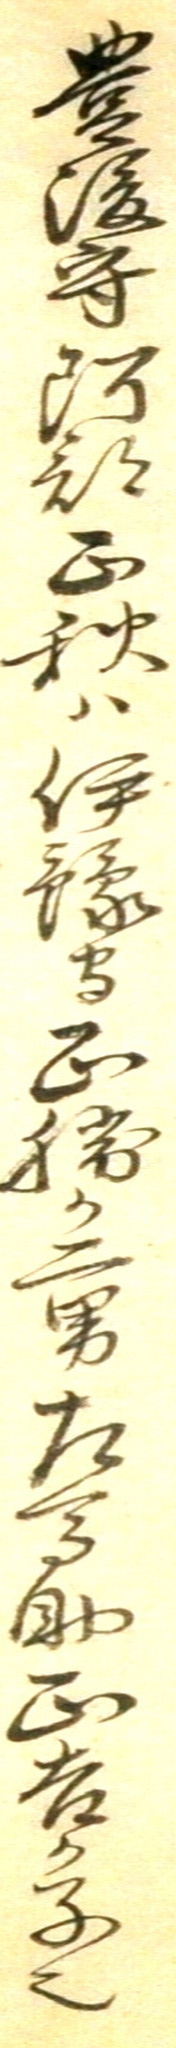豊後守阿部正秋は伊予守正勝か二男左馬助正吉か子也
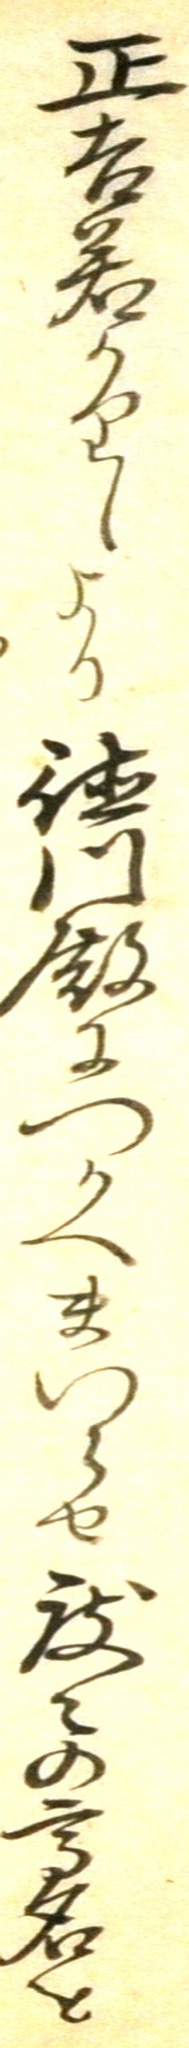正吉若かりしより徳川殿につかへまいらせ度々の高名を
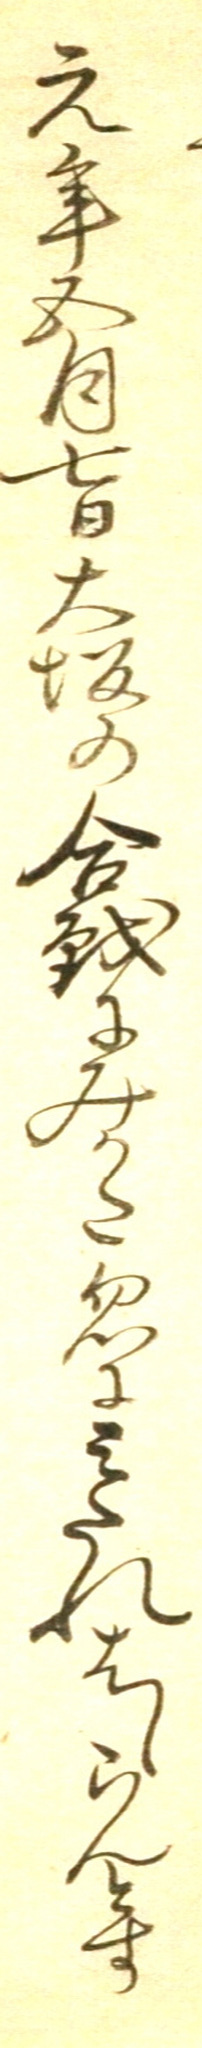元年五月七日大坂の合戦にみかた忽にみたれはしらんとす
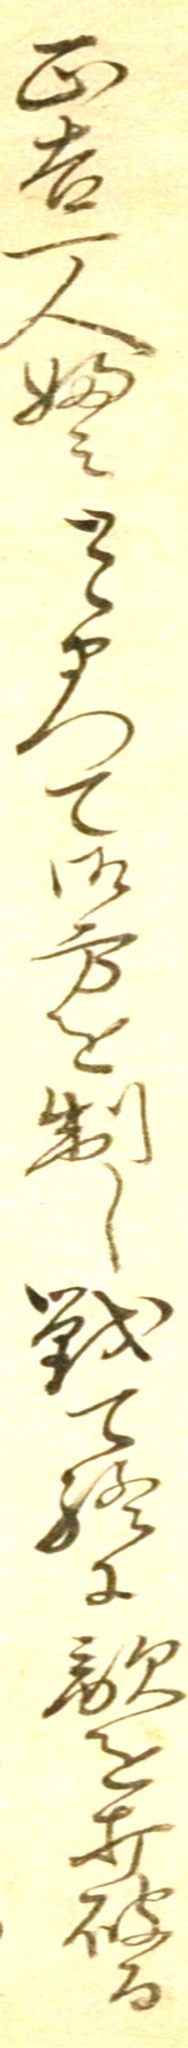正吉一人ふみとゝまつて御方を制し戦て終に敵を打破る
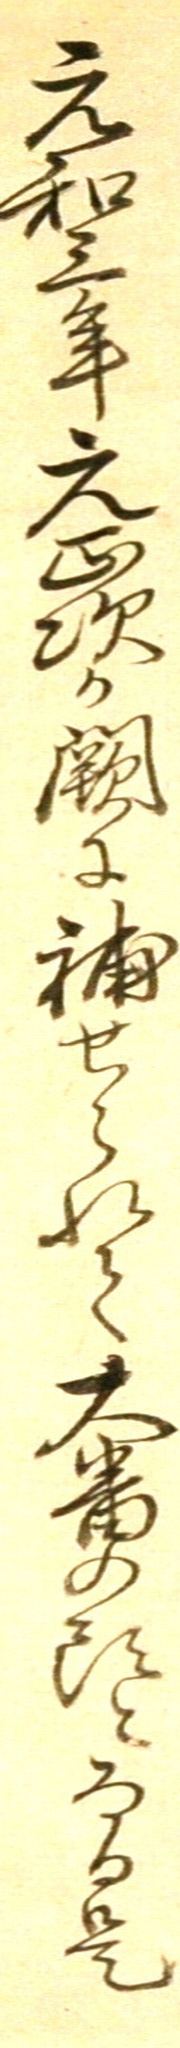元和三年元正次か闕に補せられて大番の頭となる是
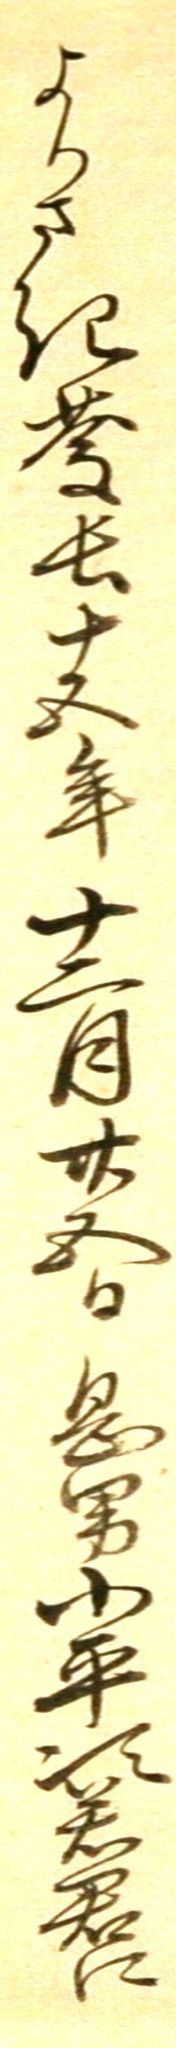よりさき慶長十五年十二月廿五日息男小平次若君に

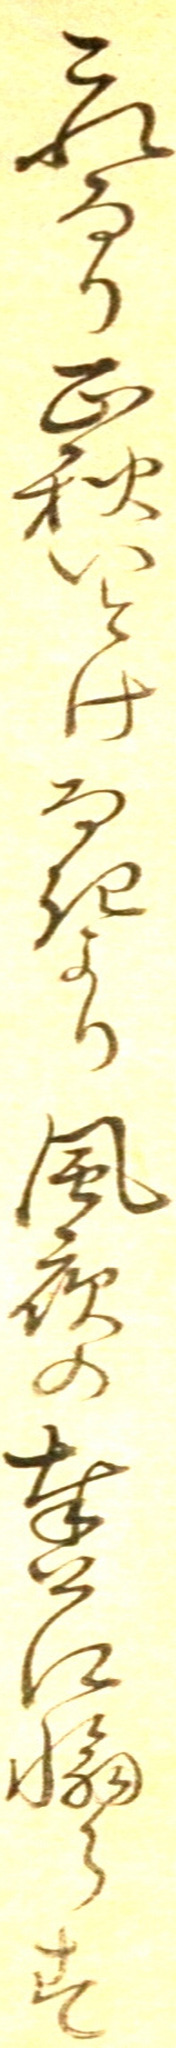これなり正秋いとけなきより風夜の奉公に懈らす
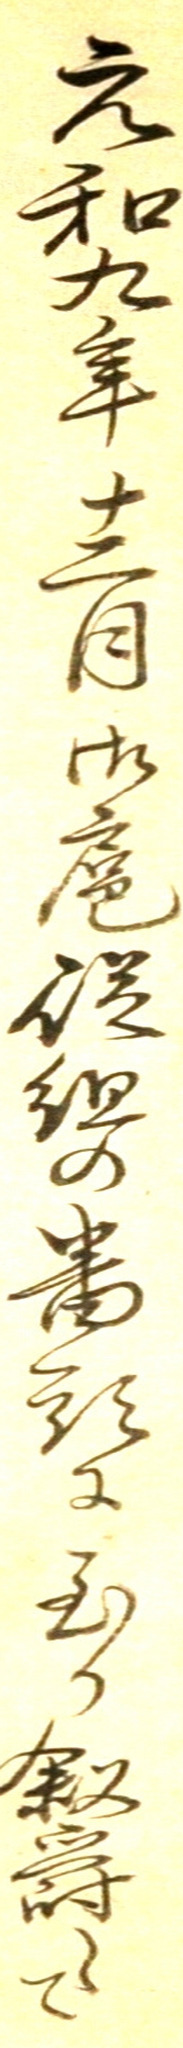元和九年十二月御扈従組の番頭に至り叙爵して
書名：藩翰譜（五）
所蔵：伊那市立高遠町図書館・合同会社AMANE
